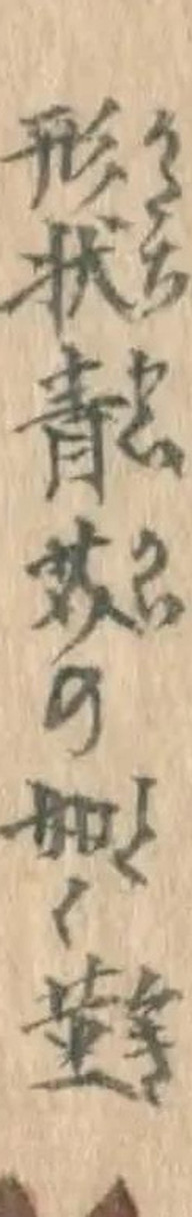形状青芥の如く茎
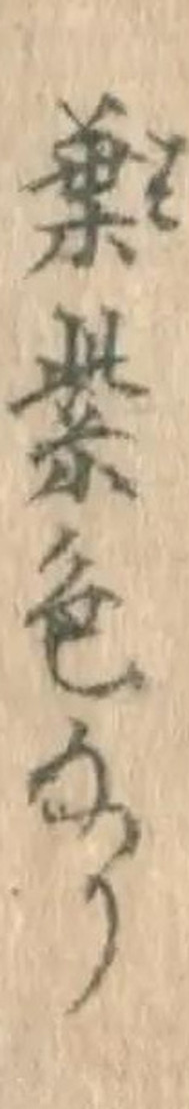葉紫色なり
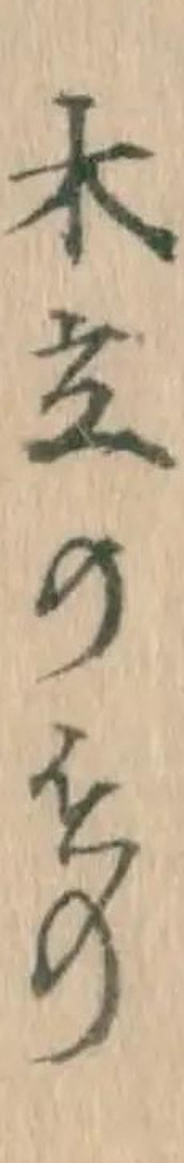木立のもの
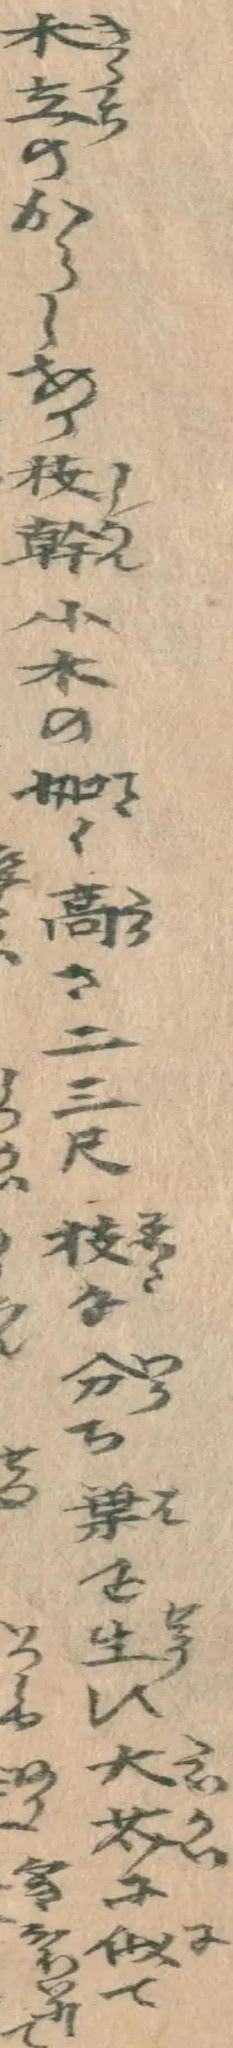木立のからしあり枝幹小木の如く高さ二三尺枝を分ち葉を生す大芥に似て
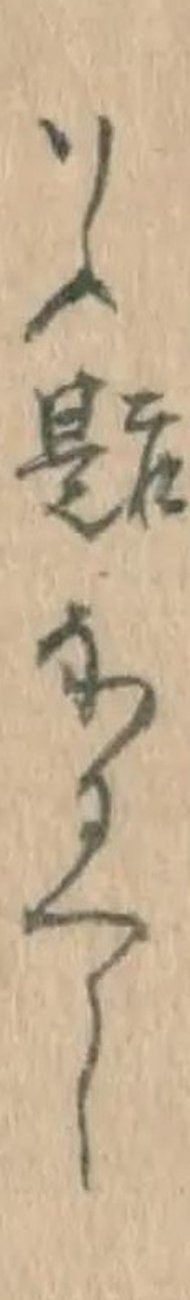いふ是なるへし

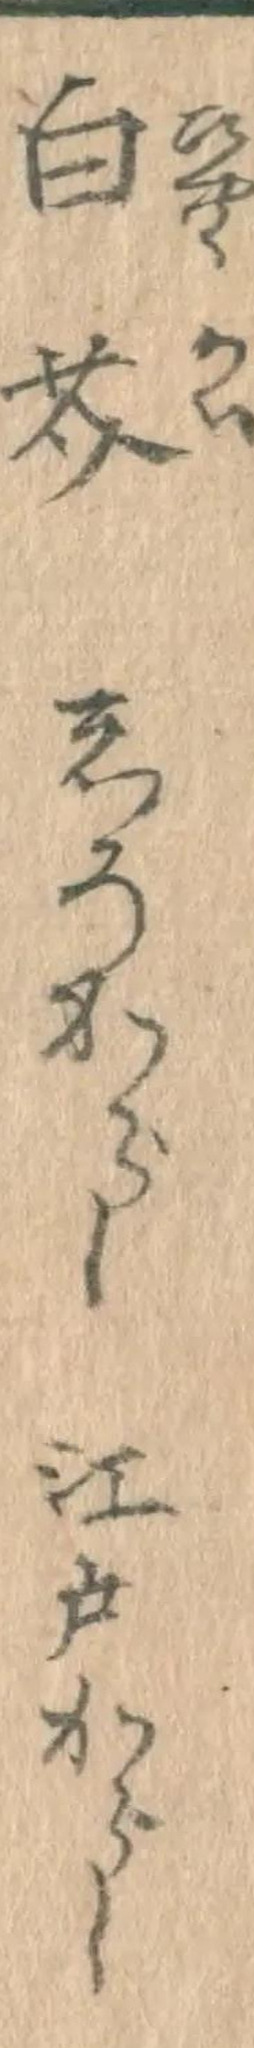白芥しろからし江戸からし
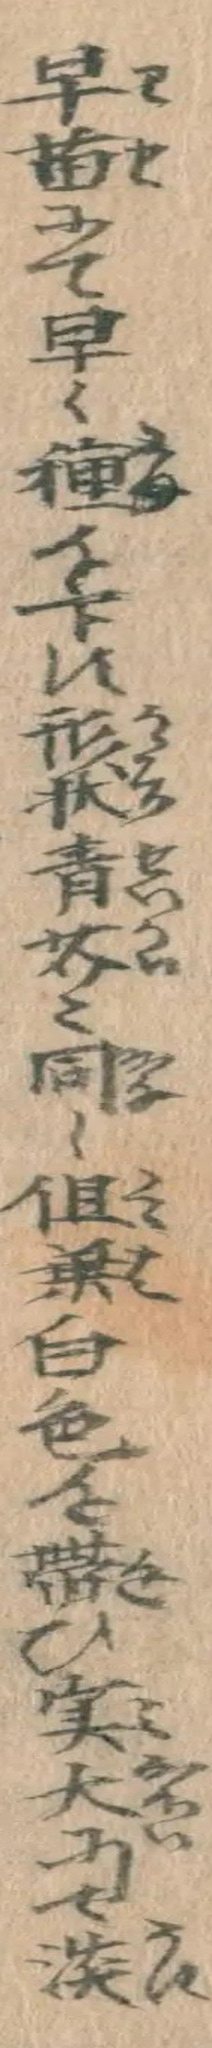早苗にて早く種を下す形状青芥と同し但葉白色を帯ひ実大にして淡
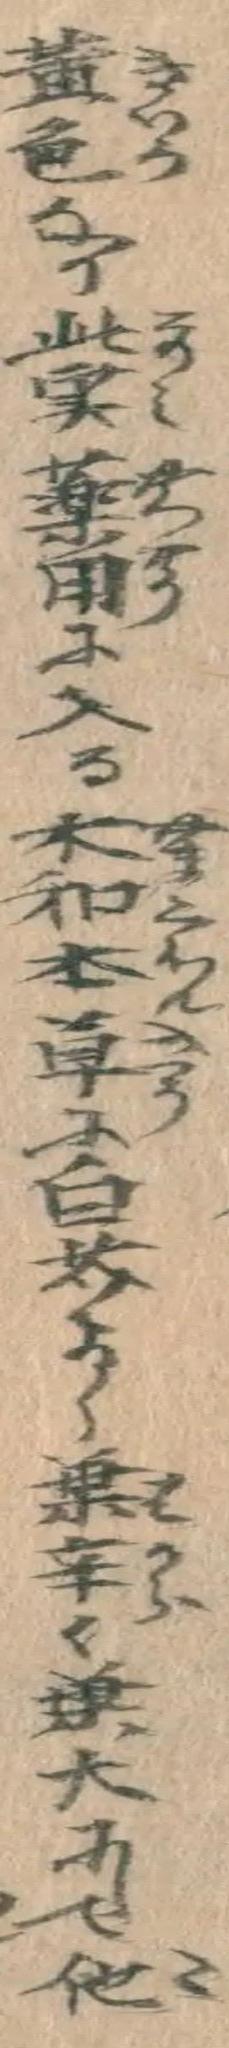黄色なり此実薬用に入る大和本草に白芥よし葉辛く葉大にして他
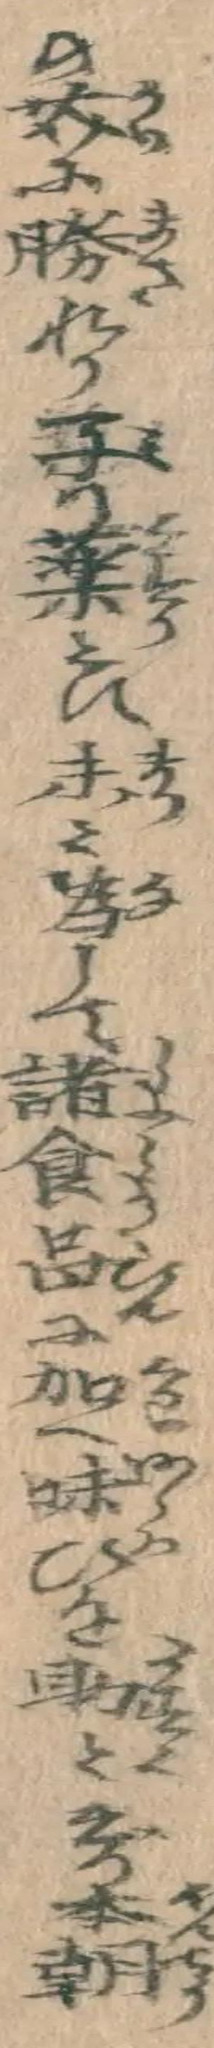の芥に勝れり子は薬とす末と為して諸食品に加へ味ひを助と云り本朝
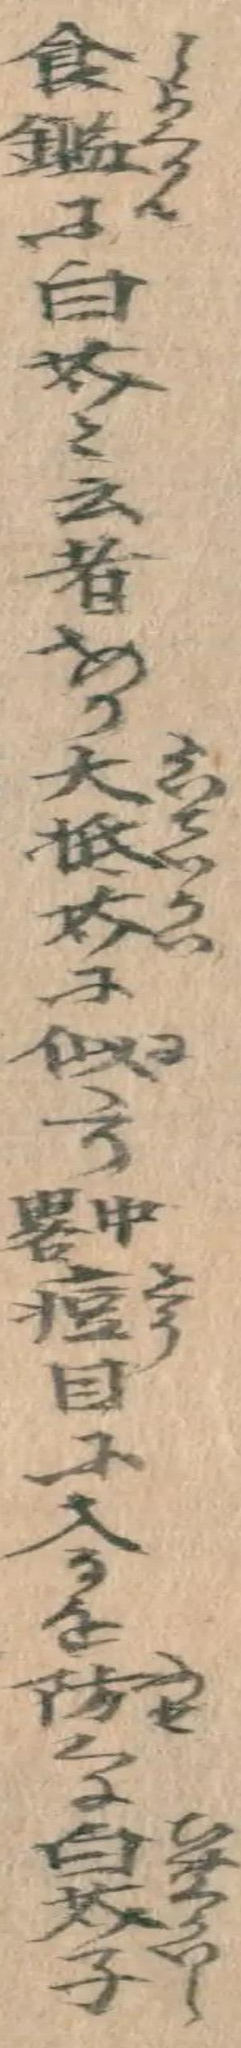食鑑に白芥と云者あり大抵芥に似たり中略痘目に入るを防くに白芥子
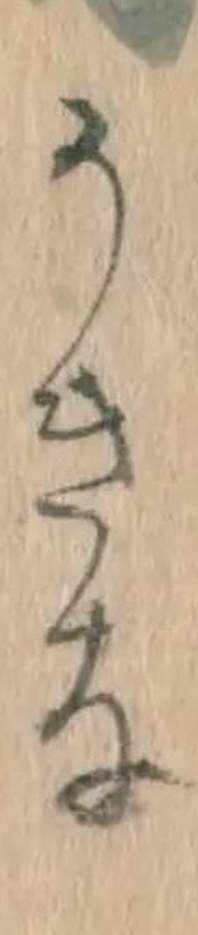うきな
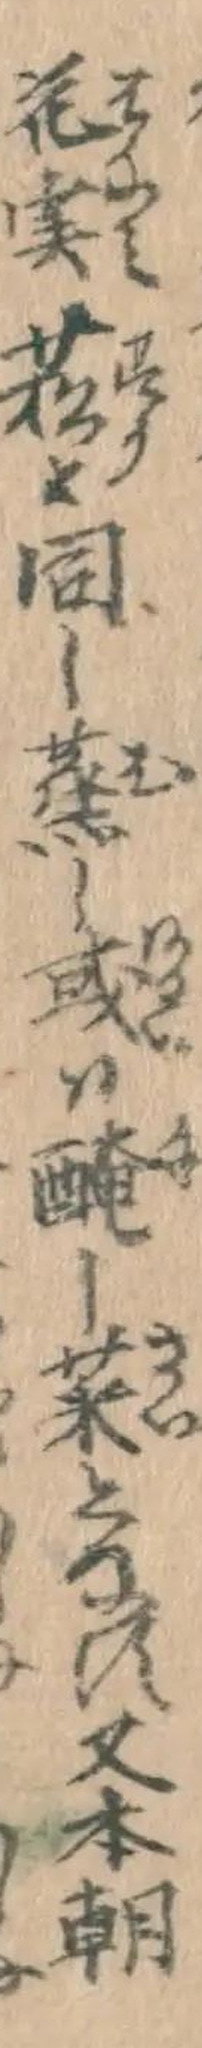花実菘と同し蒸し或は醃し菜となす又本朝
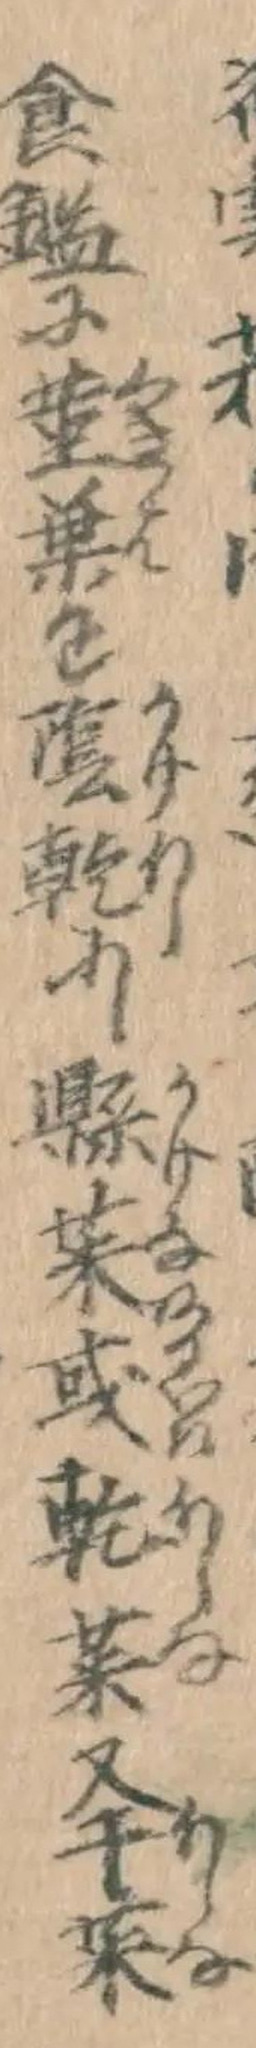食鑑に茎葉を陰乾にし県菜或乾菜又干菜
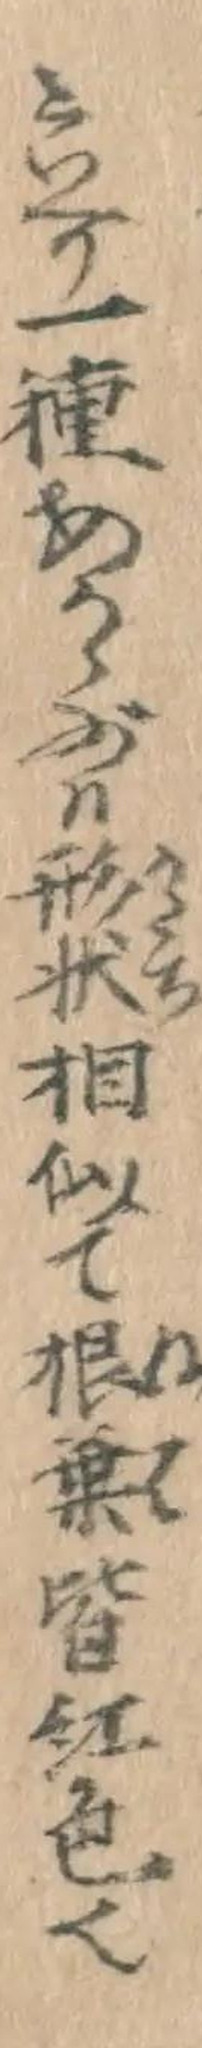といへり一種あかゝぶは形状相似て根葉皆紅色也

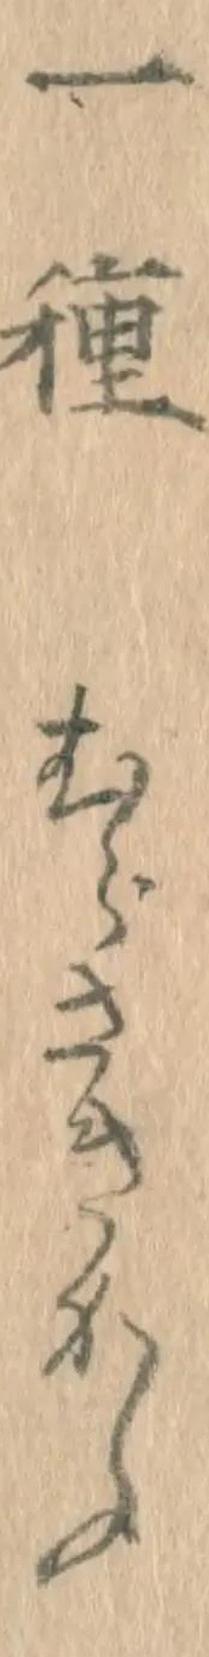一種むらさきかふ
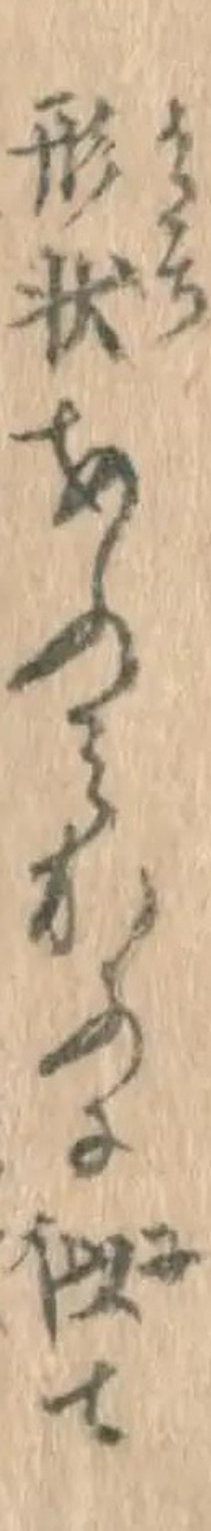形状あふみかふに似て
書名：本草図譜. 巻46-48
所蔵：国立国会図書館 National Diet Library, JAPAN
